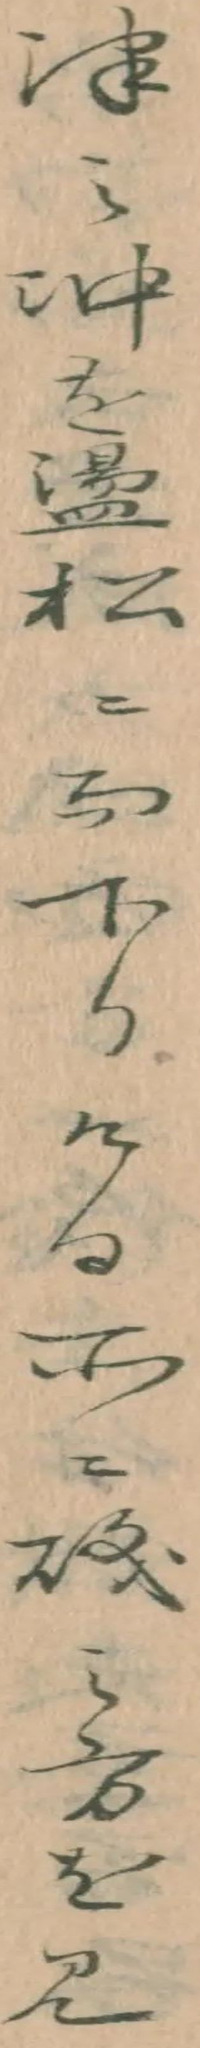津之沖を盪松に而下りける所に磯之方を見
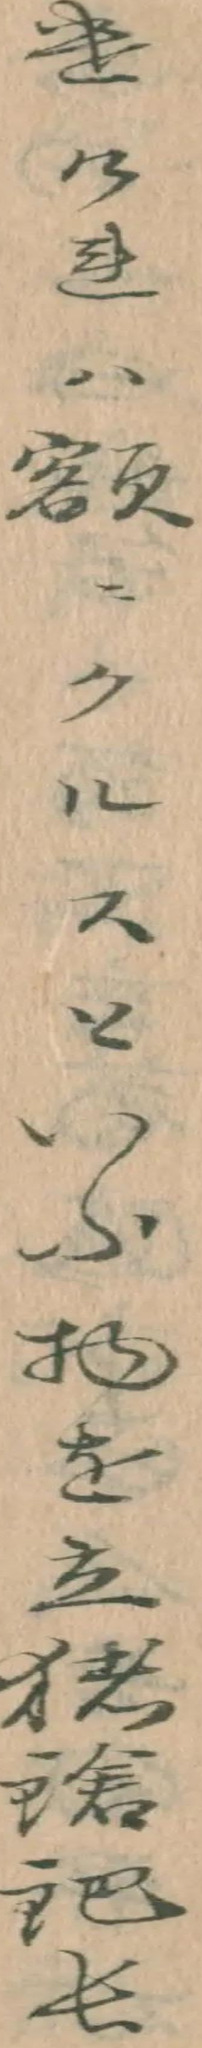遣け連は額にクルスといふ物を立猪鎗鈀長
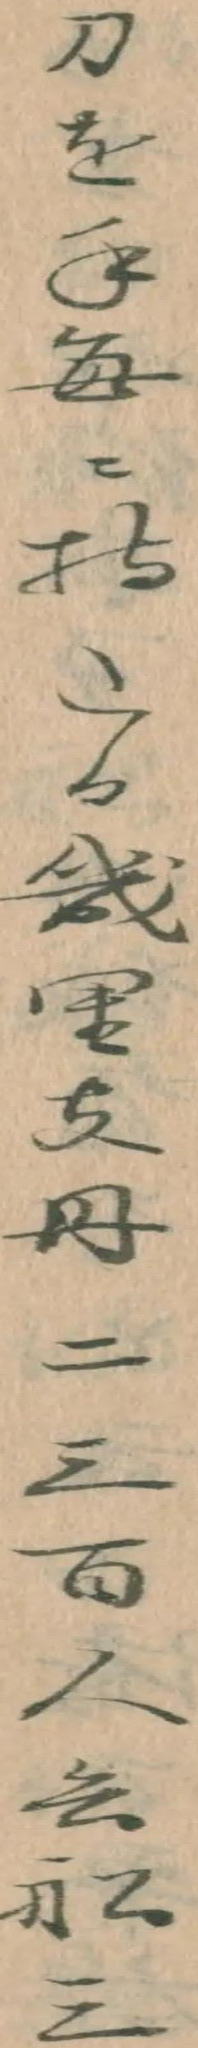刀を手毎に持たる幾里支丹二三百人兵舩三
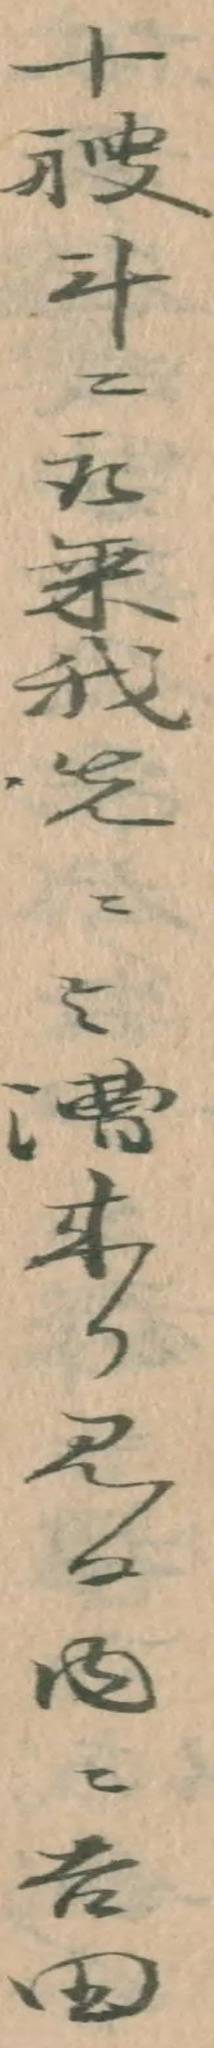十艘斗に取乗我先にと漕来り見る内に吉田
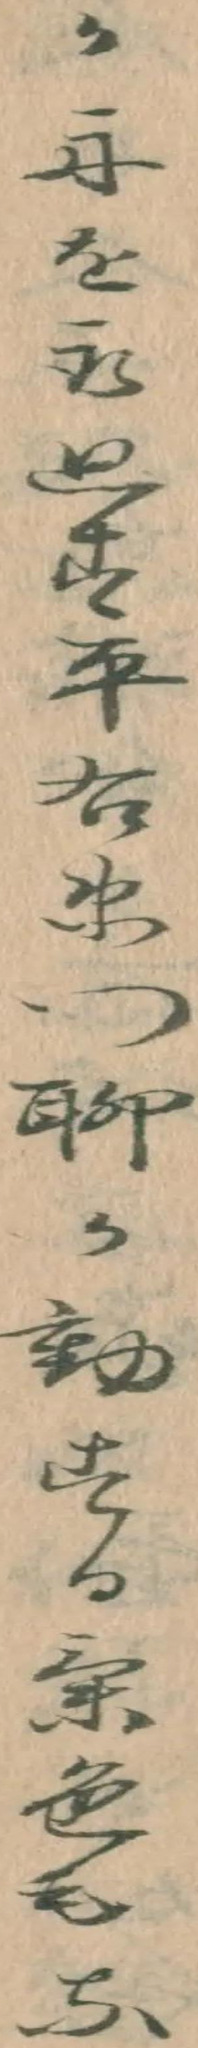か舟を取廻春平右衛門聊か動春る気色もな
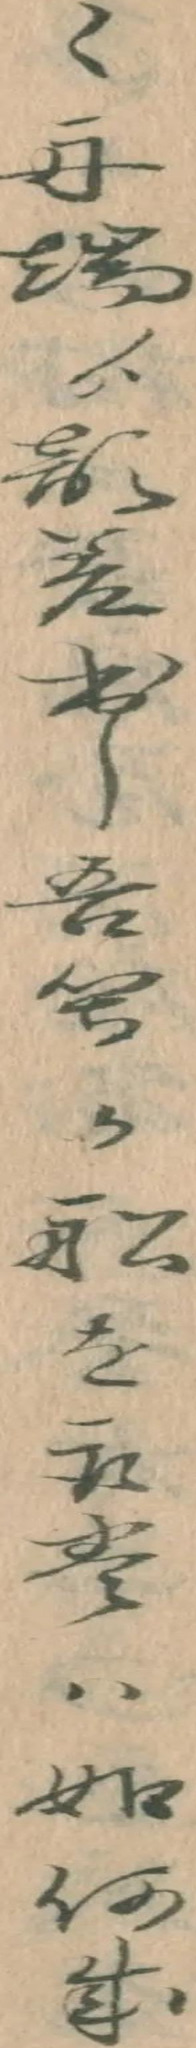く舟場ゟ顔差出し吾等か舩を取巻は如何成
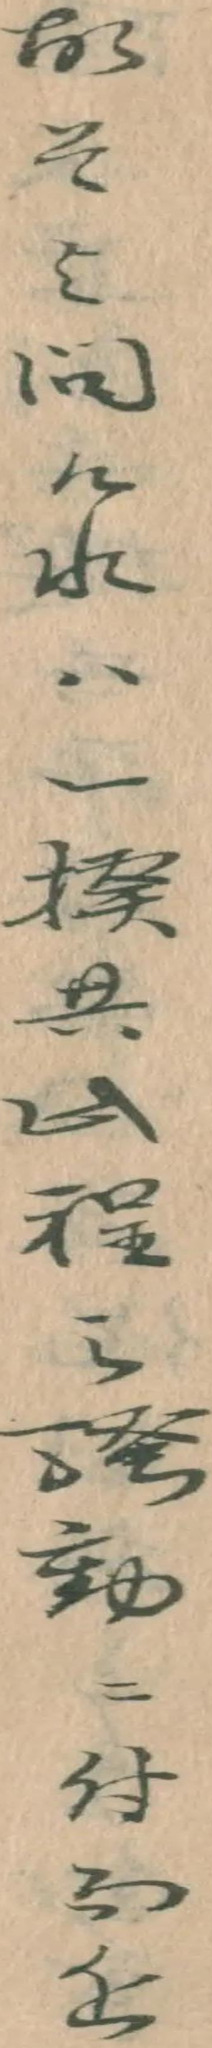故そ与問けれは一揆共此程之騒動に付而近
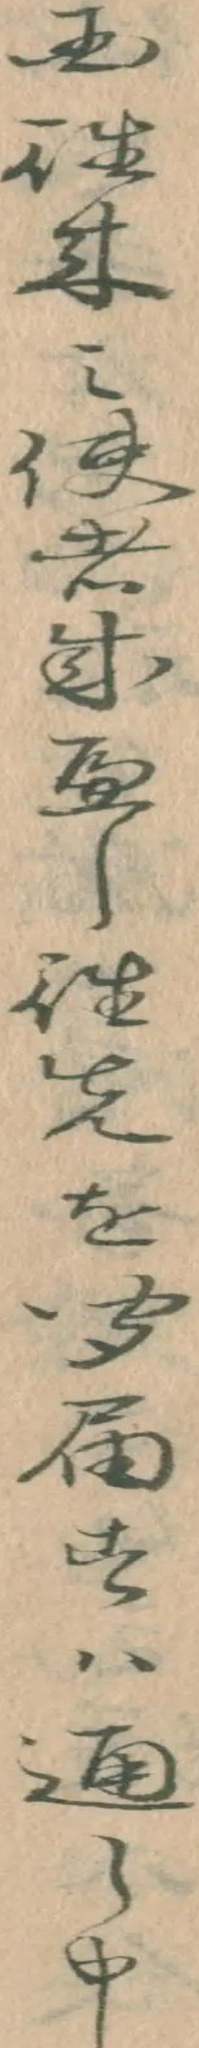国往来之使者成扁し往先を聞届春は通し申
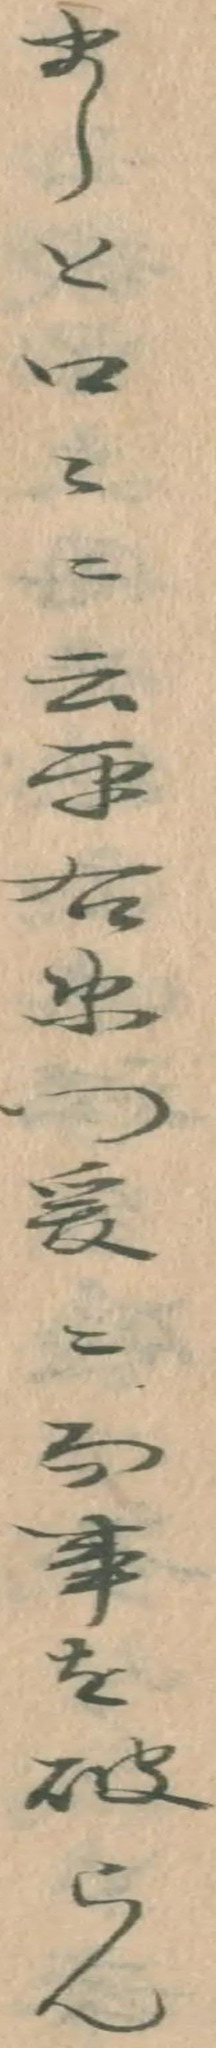ましと口々に云平右衛門爰に而事を破らん
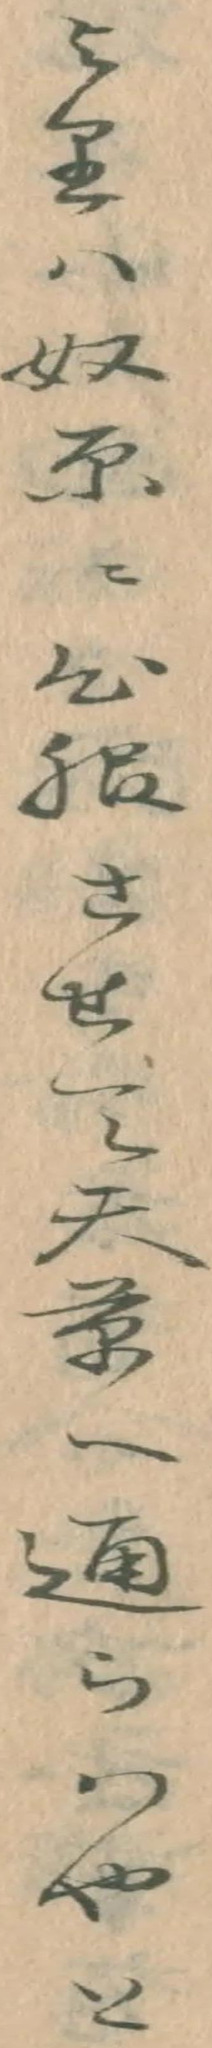与里は奴原に心服させて天草へ通らはやと

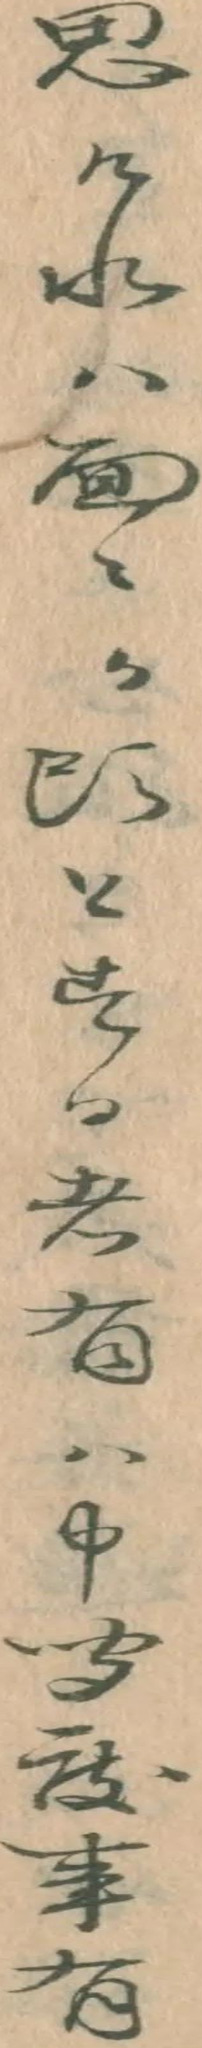思けれは面々か頭と春る者有は申聞度事有
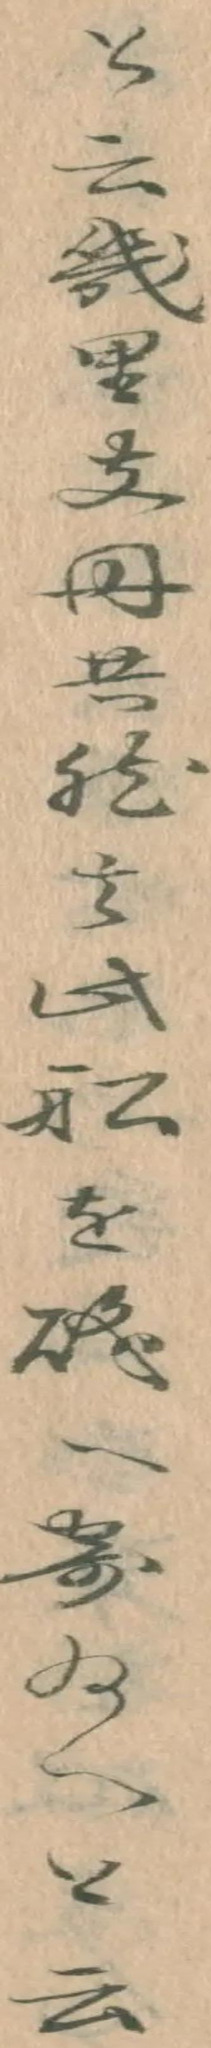と云幾里支丹共然者此舩を磯へ寄ゐへと云
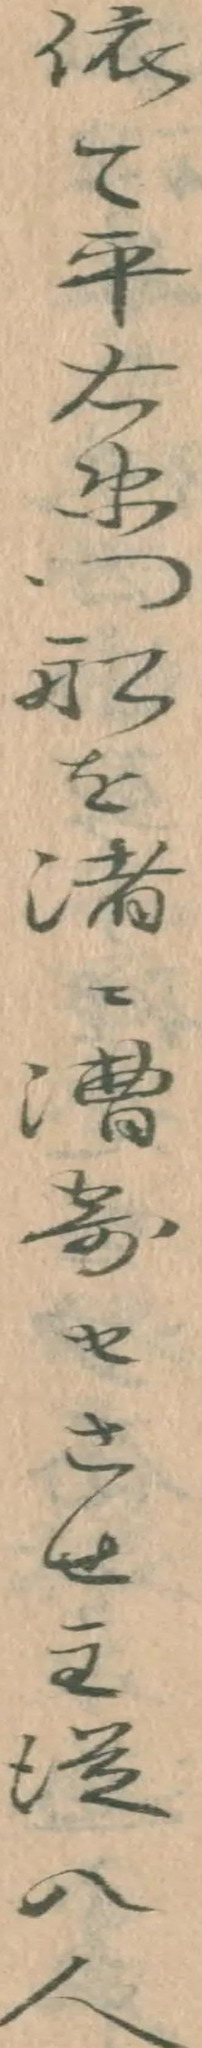依て平右衛門舩を渚に漕寄せさせ主従八人
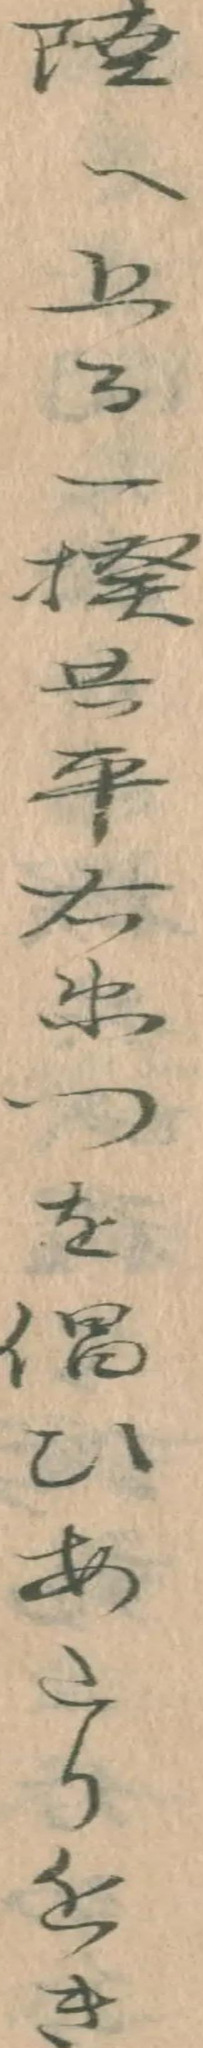陸へ上る一揆共平右衛門を倡ひあたり近き
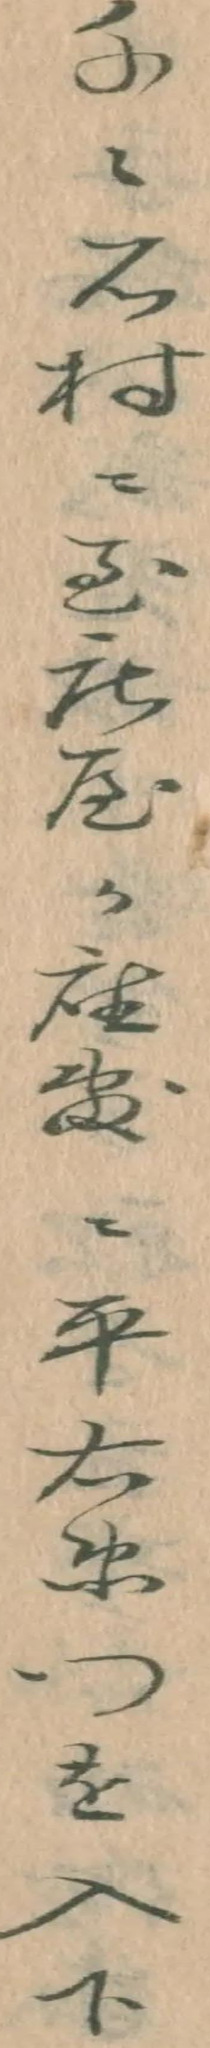千々石村に至庄屋か座敷に平右衛門を入下
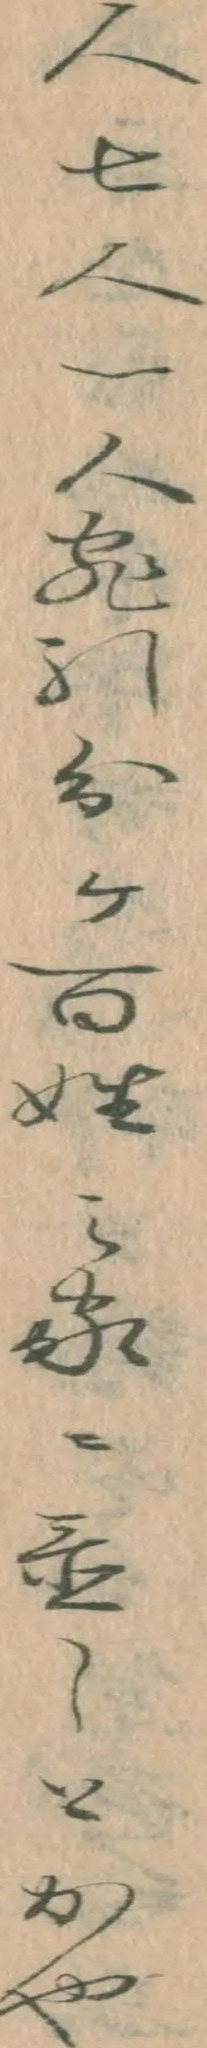人七人一人究引分け百姓之家に置しとか也
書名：切支丹御退治記 49巻. [2]
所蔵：国立国会図書館 National Diet Library, JAPAN
